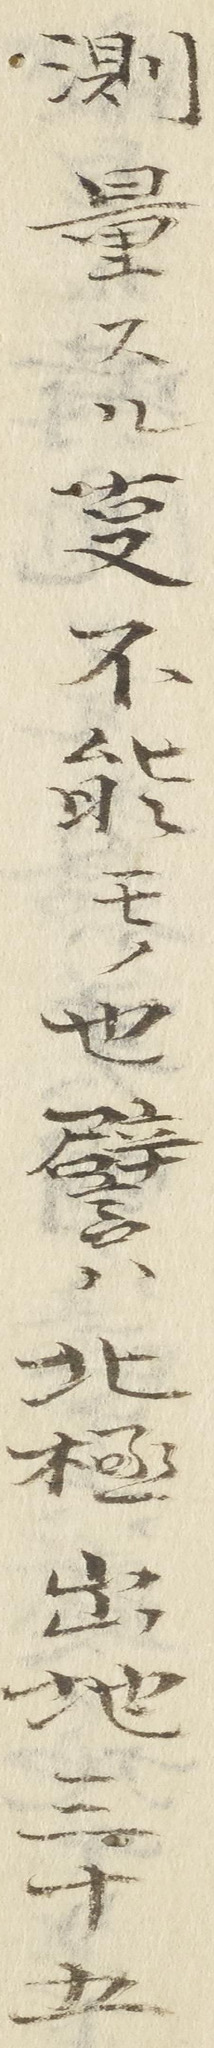測量スル事不能モノ也譬ハ北極出地三十五
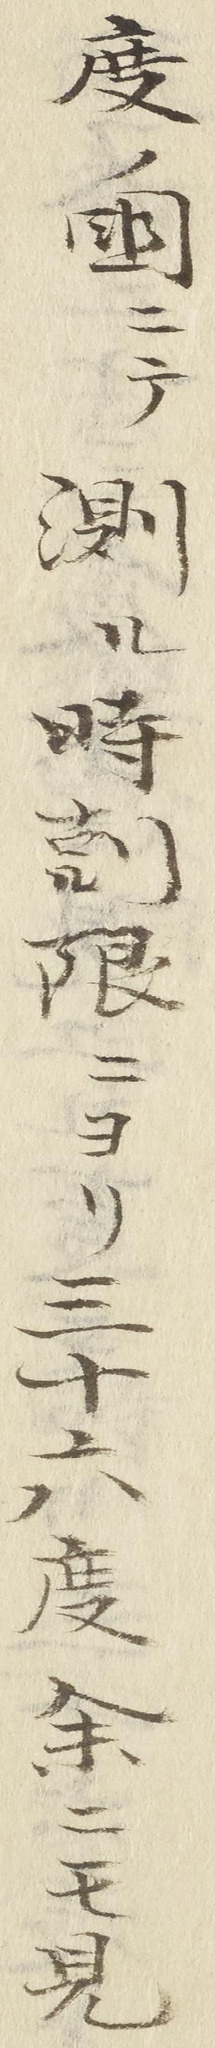度ノ国ニテ測ル時剋限ニヨリ三十六度余ニモ見

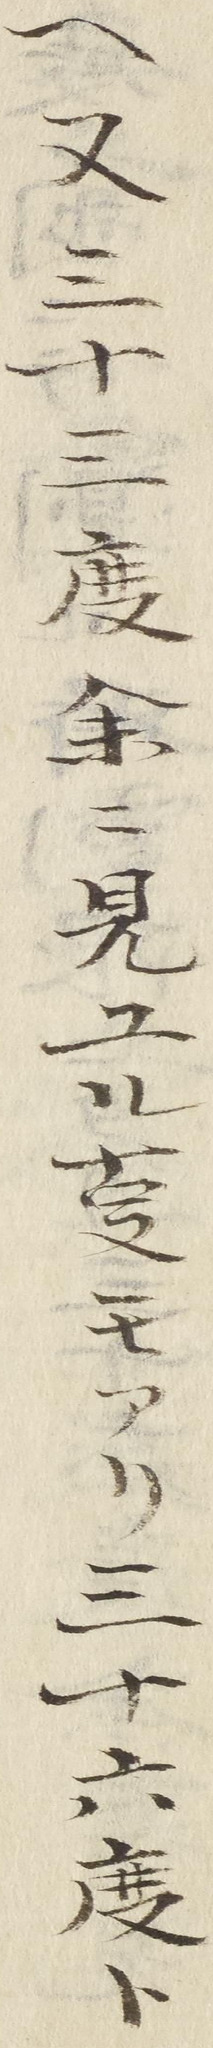ヘ又三十三度余ニ見ユル事モアリ三十六度ト
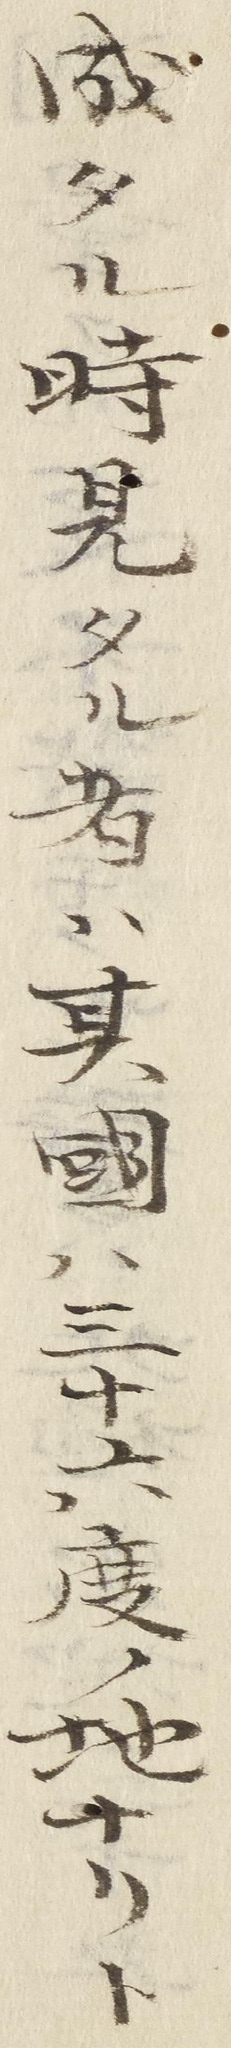成タル時見タル者ハ其国ハ三十六度ノ地ナリト
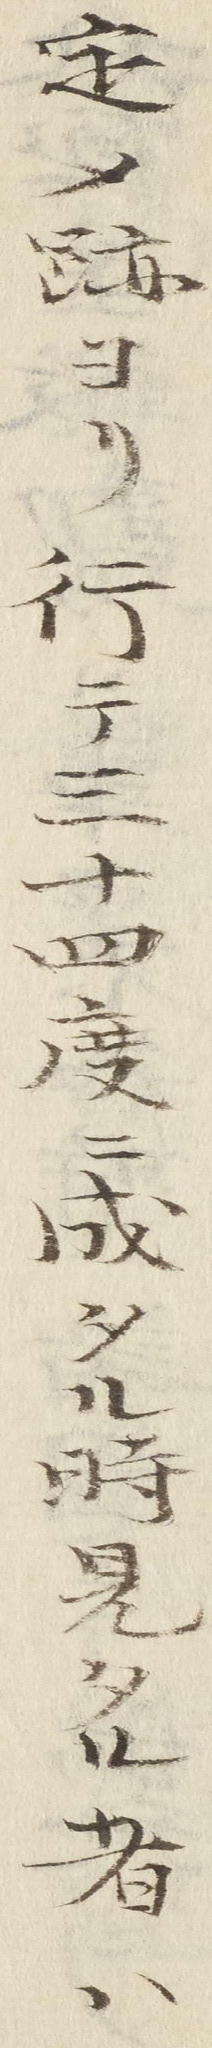定メ跡ヨリ行テ三十四度ニ成タル時見タル者ハ
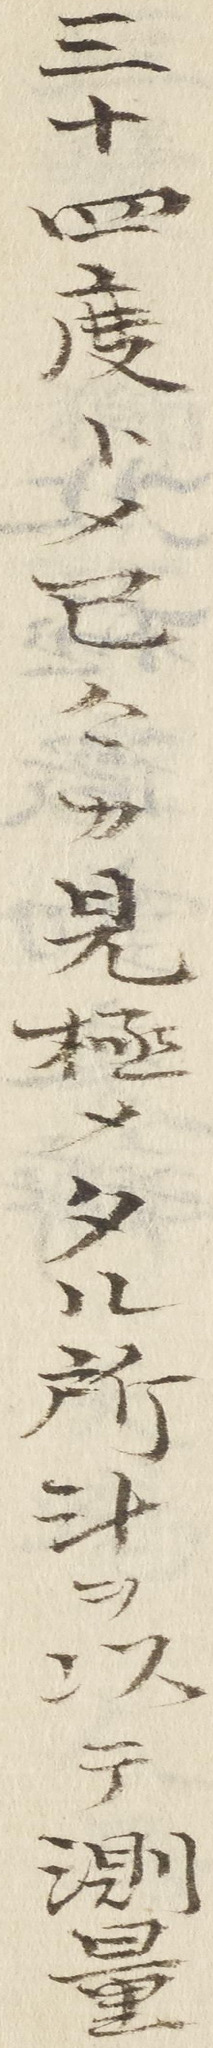三十四度トシテ己々カ見極メタル所計ヲ以テ測量
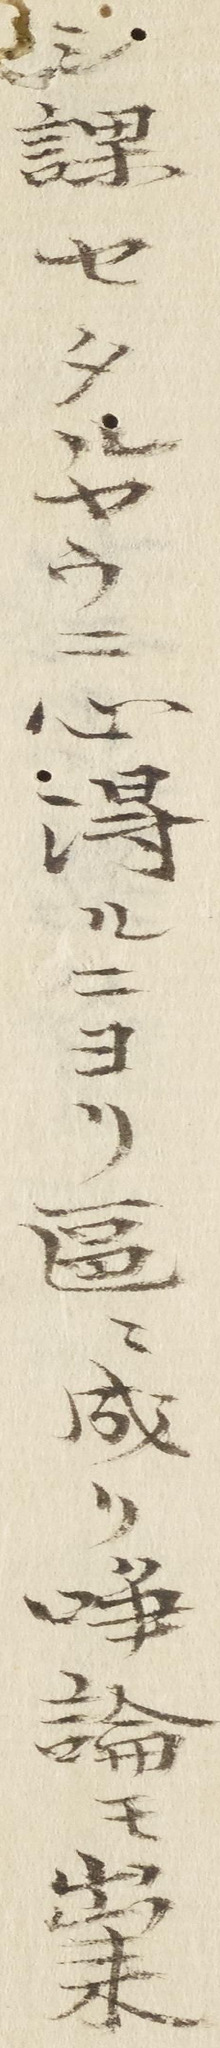シ課セタルヤウニ心得ルニヨリ区ニ成リ𠲜論も出来
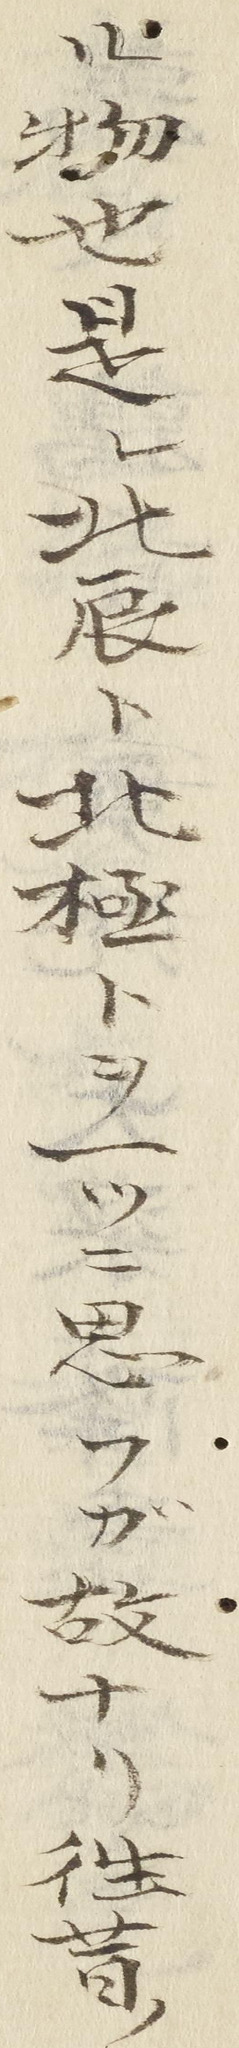ル物也是レ北辰ト北極トヲ一ツニ思フガ故ナリ往昔ノ
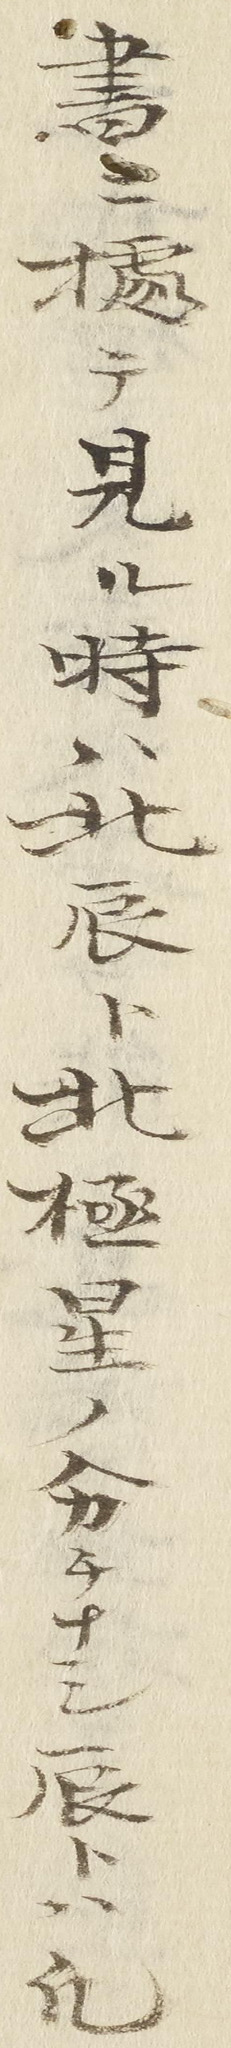書ニ拠テ見ル時ハ北辰ト北極星の分チナシ辰トハ凡
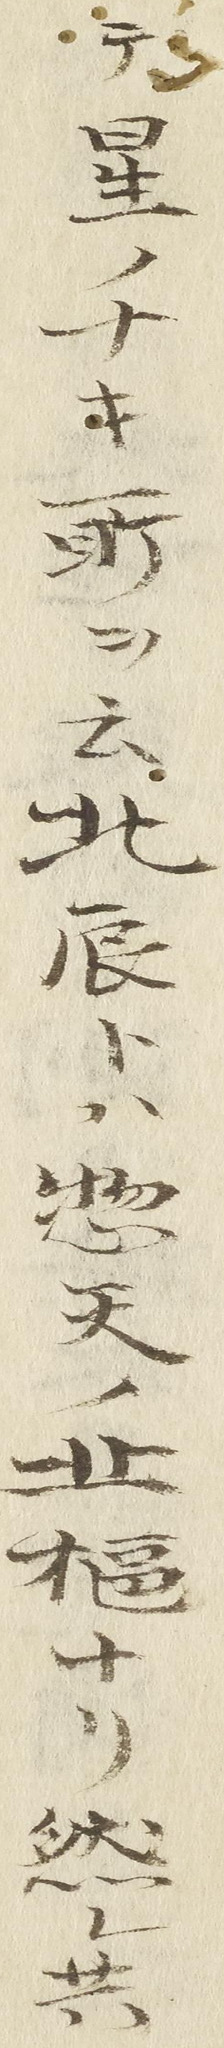テ星ノナキ所ヲ云北辰トハ惣天ノ北枢ナリ然レ共
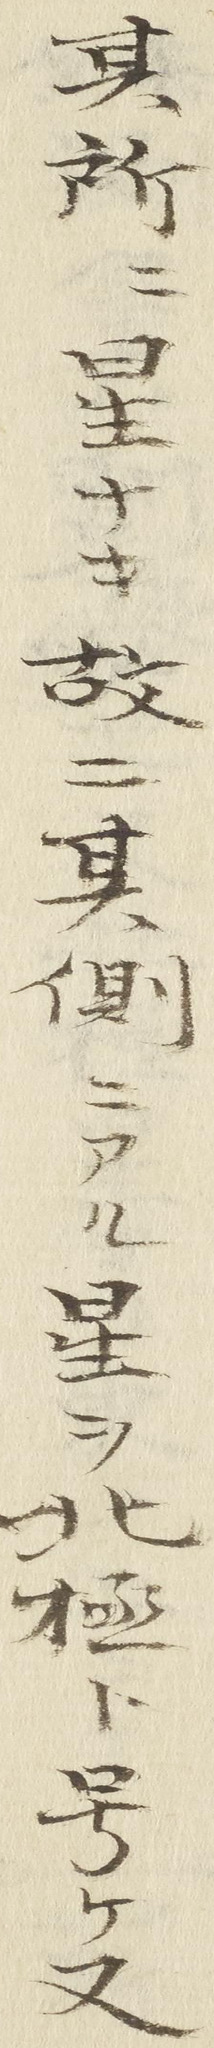其所ニ星ナキ故ニ其側ニアル星ヲ北極ト号ケ又
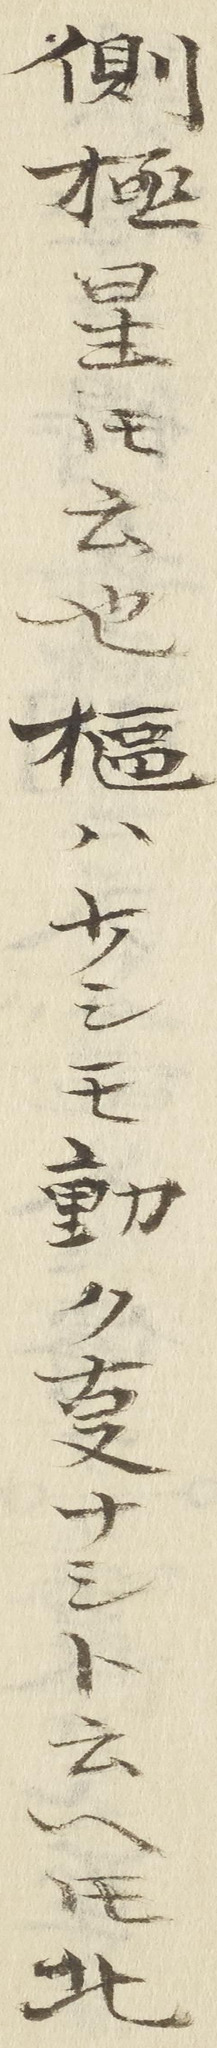側極星トモ云也枢ハ少シモ動ク事ナシト云へトモ北
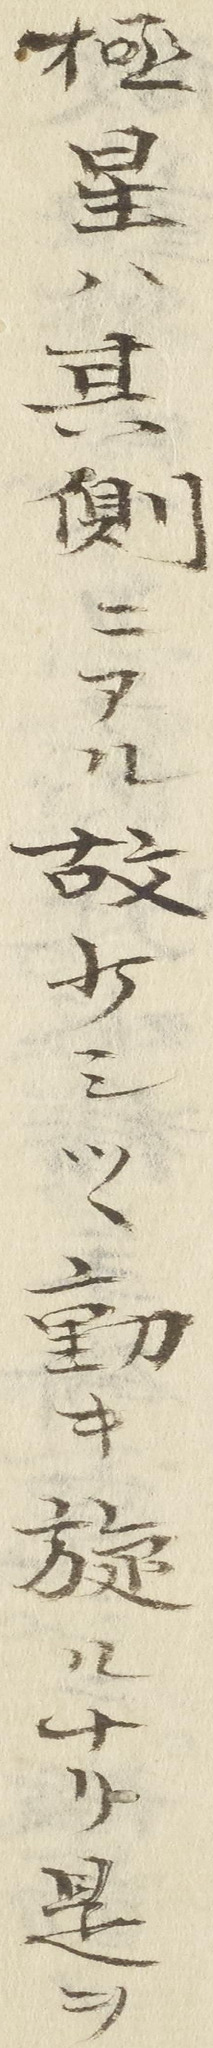極星ハ其側ニアル故少シツヽ動キ旋ルナリ是ヲ
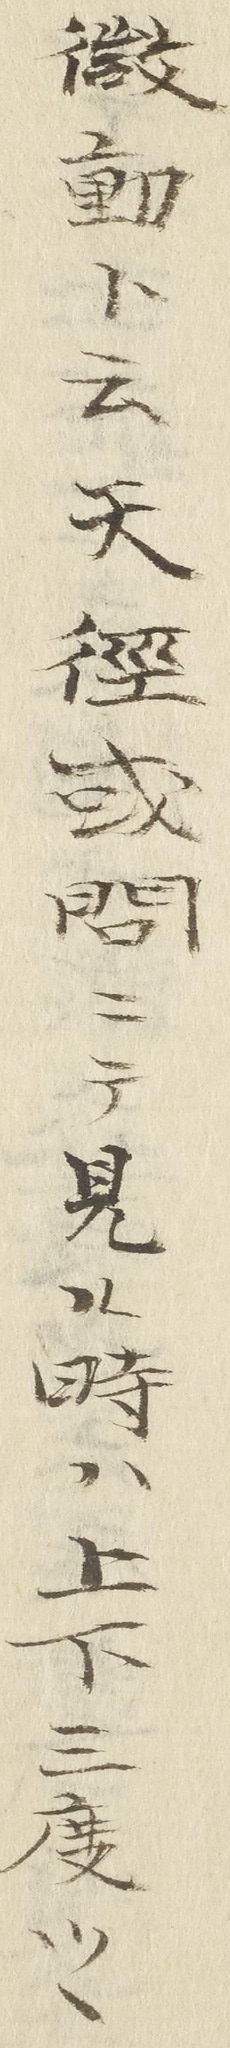微動ト云天径或問ニテ見ル時ハ上下三度ツヽ

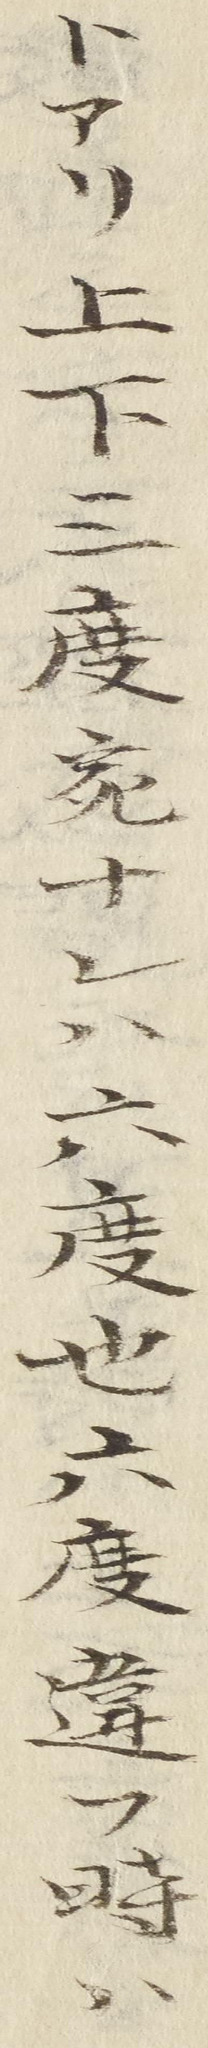トアリ上下三度宛ナレハ六度也六度違フ時ハ
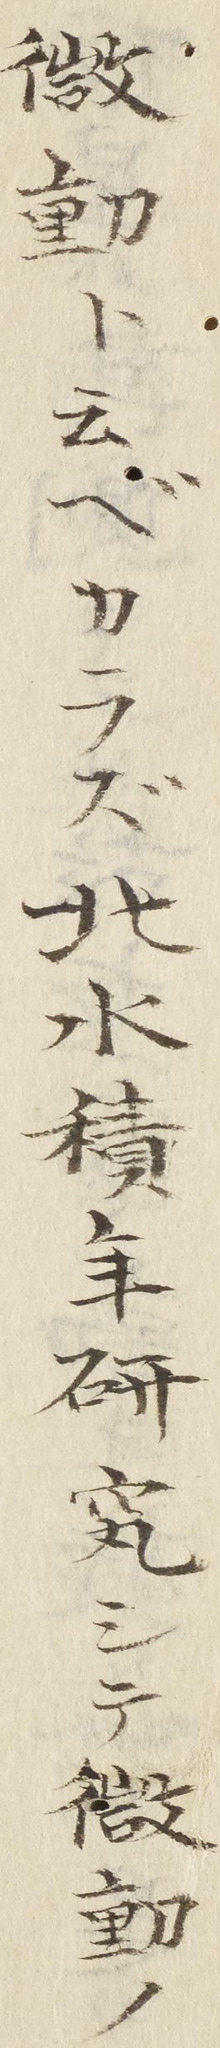微動ト云ベカラズ北水積年研究シテ微動ノ
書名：天象話説
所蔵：東京大学地震研究所図書室 Earthquake Research Institute Library, The University of Tokyo, JAPAN
